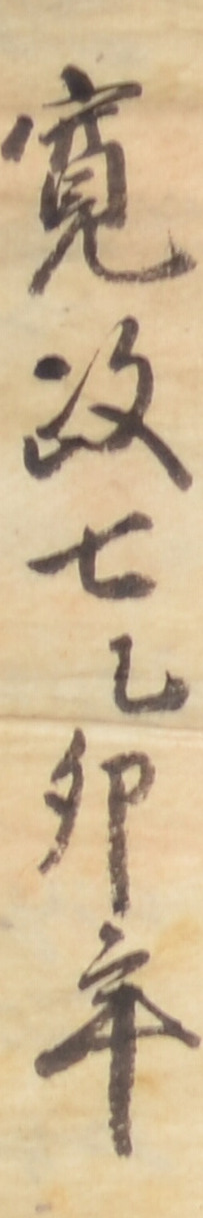寛政七乙卯年
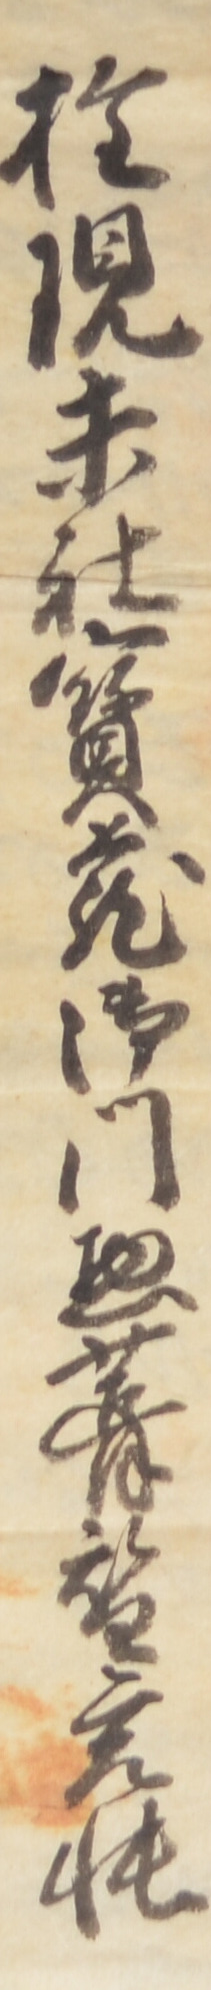権現末社寶蔵御門惣葺替覚帳

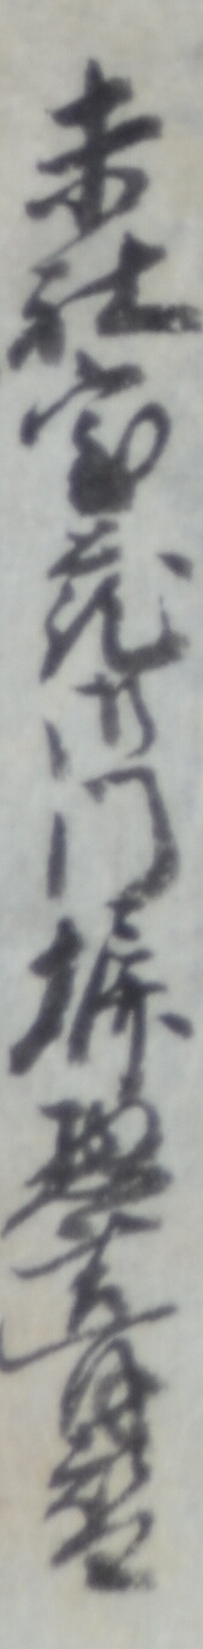末社宝蔵御門塀惣葺替
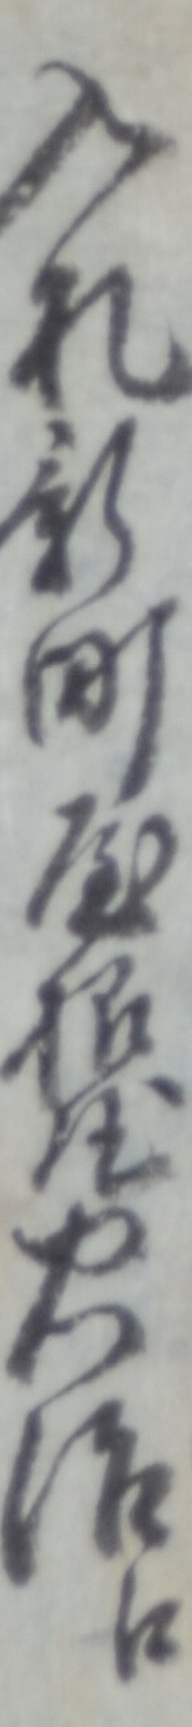入札新町屋根屋忠治江

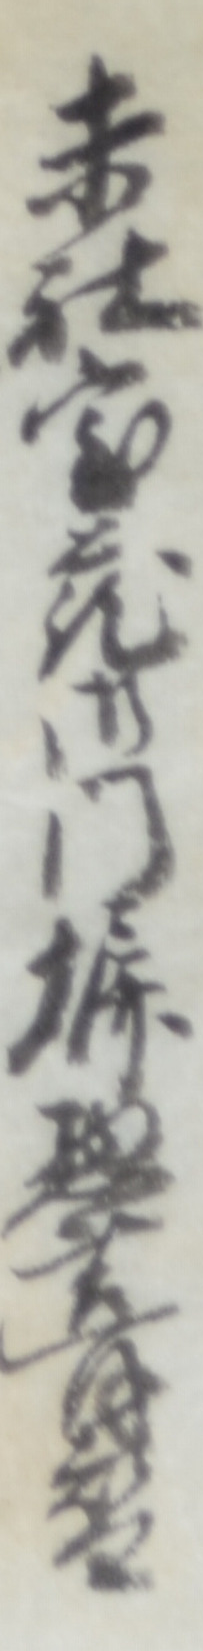末社宝蔵御門塀惣葺替
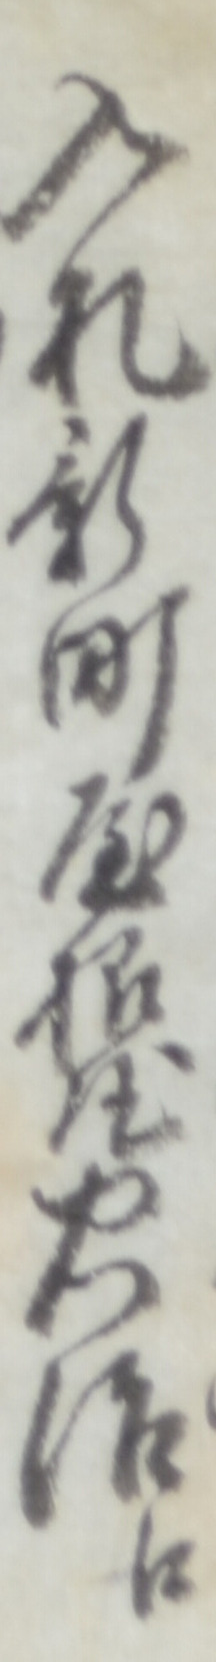入札新町屋根屋忠治江
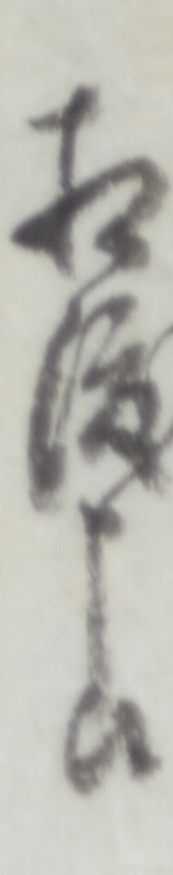相渡申候
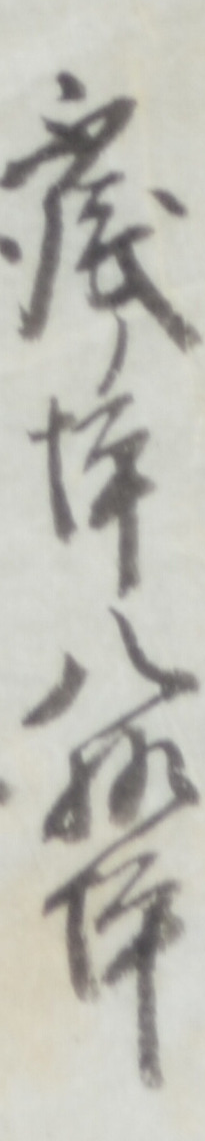不残ノ坪八拾坪
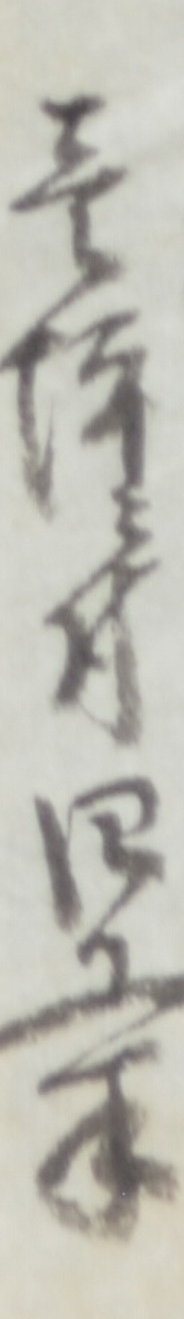壱坪ニ付四工半
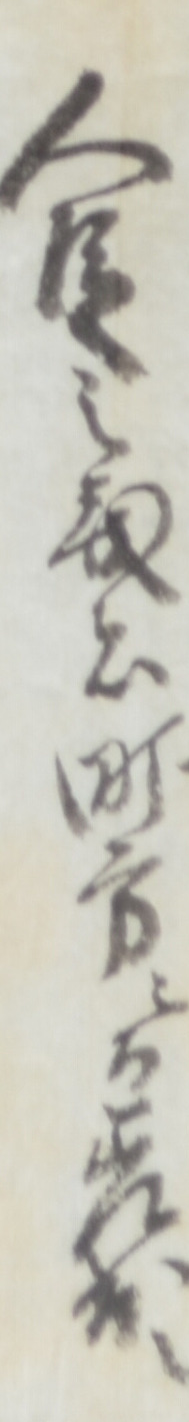人足之義者町方ニ而差出シ
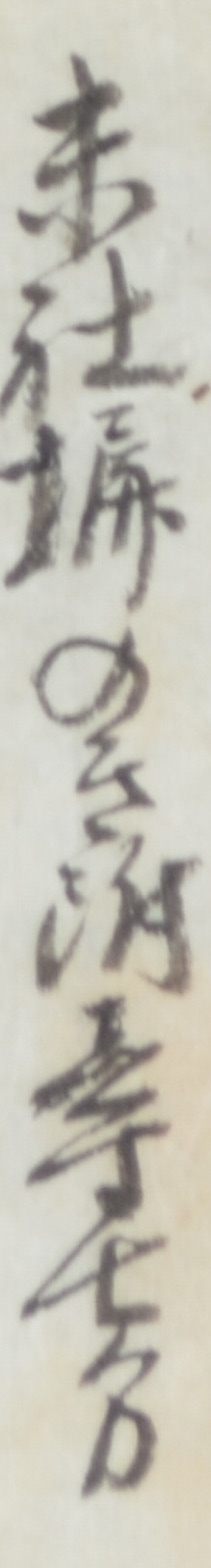末社塀のき附壱寸七分
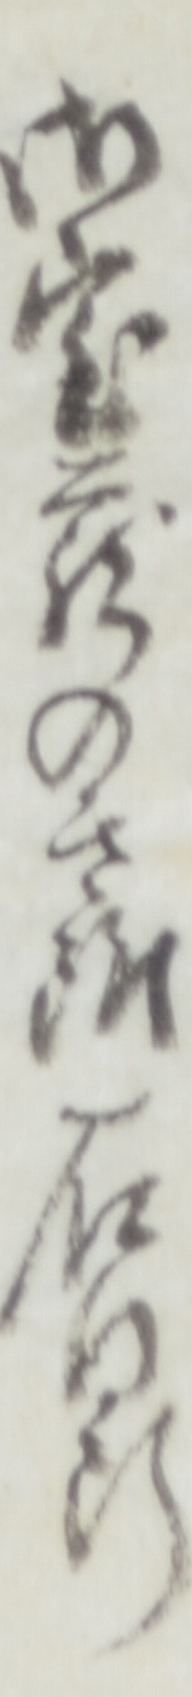御宝蔵のき附右同断
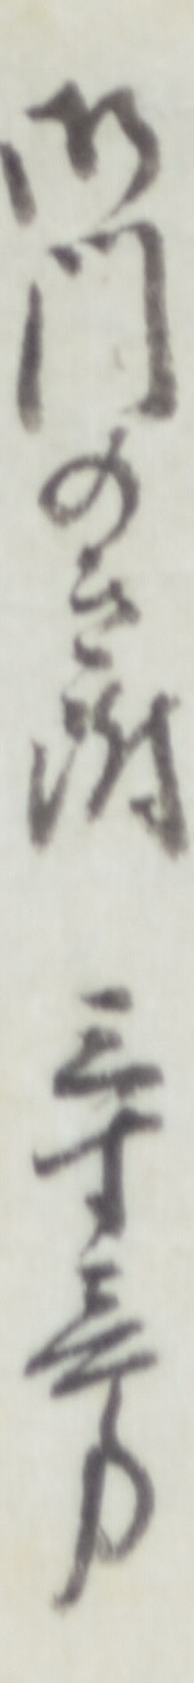御門のき附三寸壱分
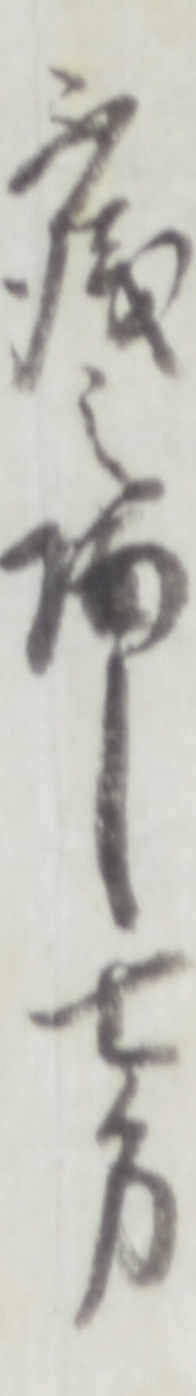不残之あし七分
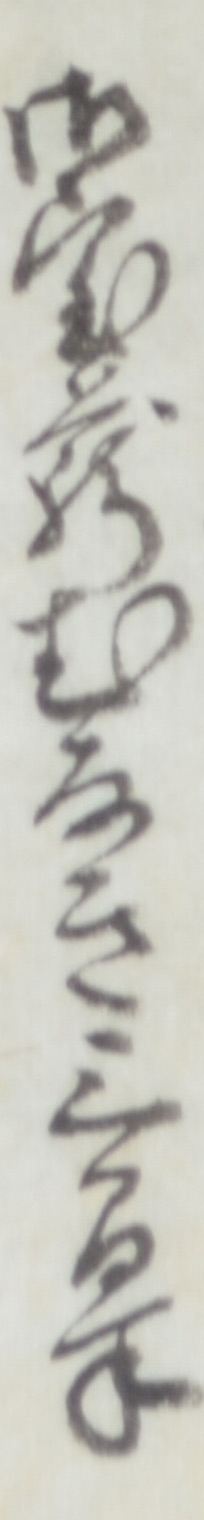御宝蔵むなき三間半
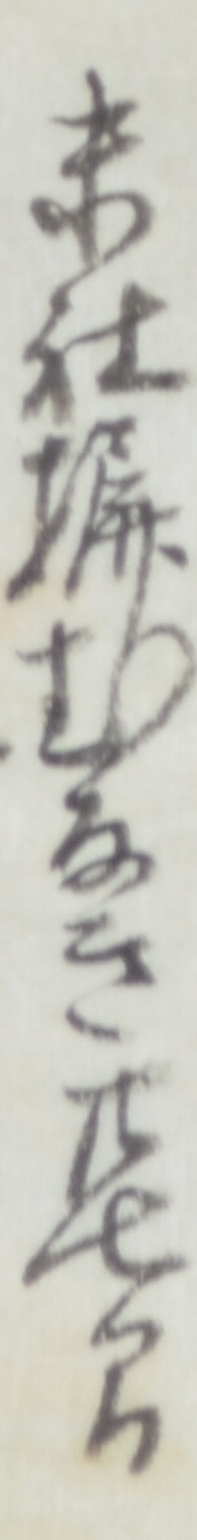末社塀むなき廿七間
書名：権現末社寶蔵御門惣葺替覚帳
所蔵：伊那市立高遠町図書館・合同会社AMANE
